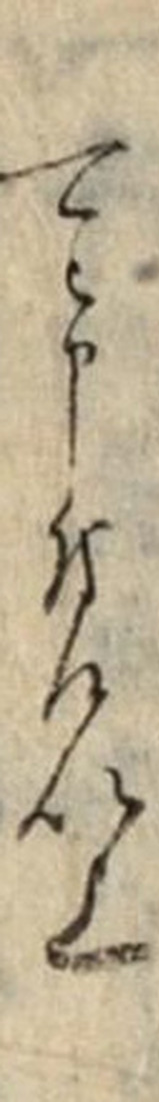可被申付候以上
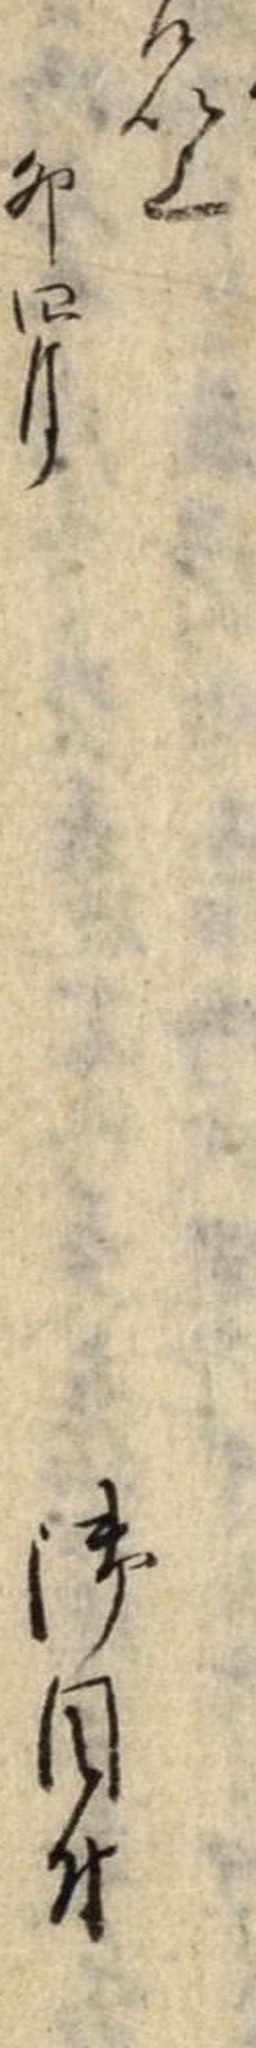卯四月御目付

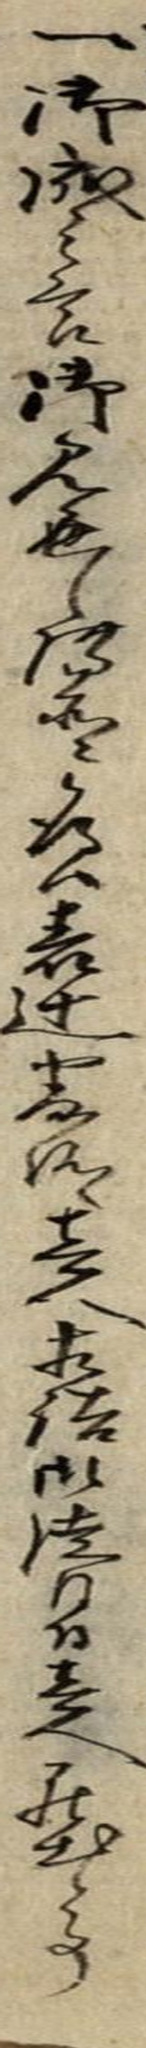一御成之節御見通し場所に候得は表辻番所へ壱人相詰御徒目付壱人罷出候事
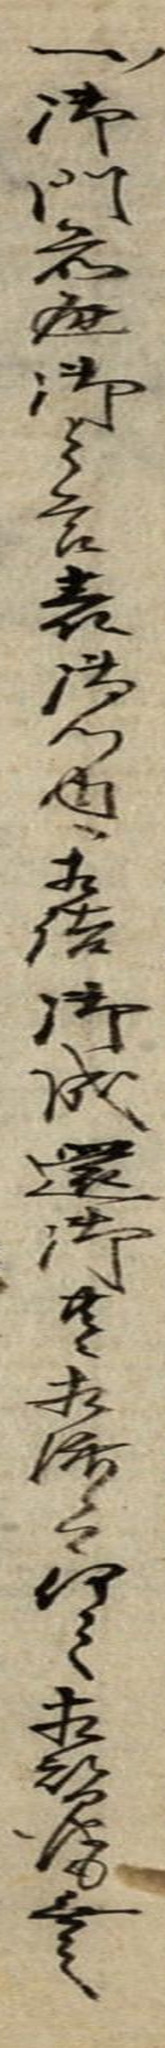一御門前通御之節表御門内へ相詰御成還御共に相済候はゝ何之相替儀も無之
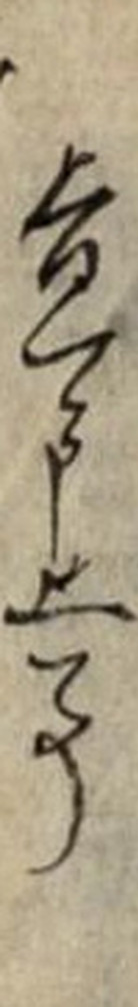旨可申上事
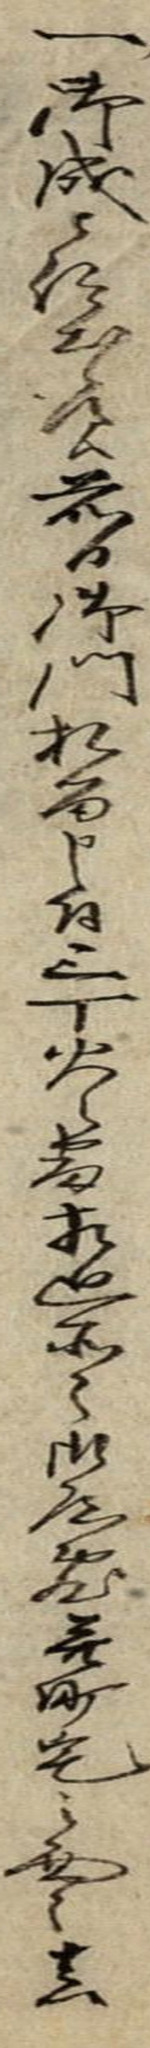一御成被仰出候得は前日御門札留申付三丁火之番相廻所之御屋敷并町宅之面々真
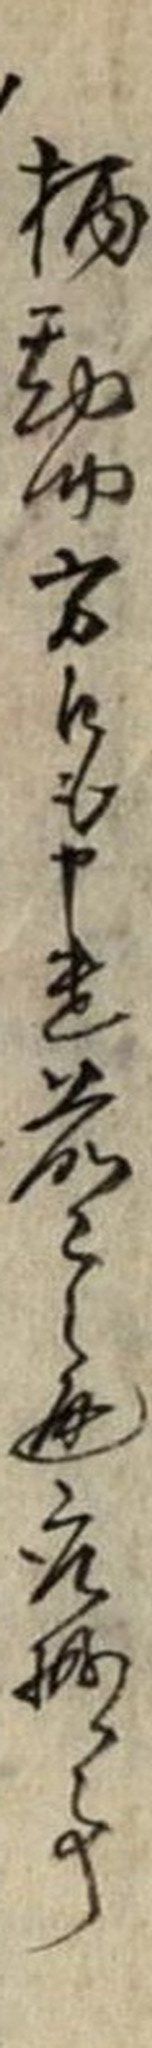柄勘助方江も申遣前々之通取扱候事
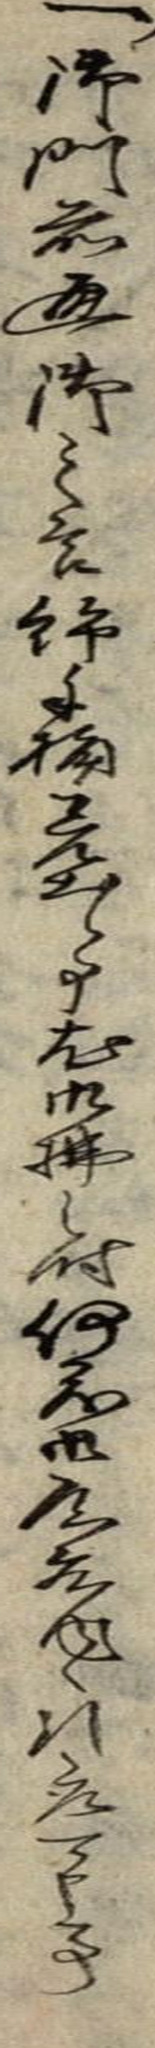一御門前通御之節飾手桶差出事尤御払之時何も御屋敷内へ引取可申事
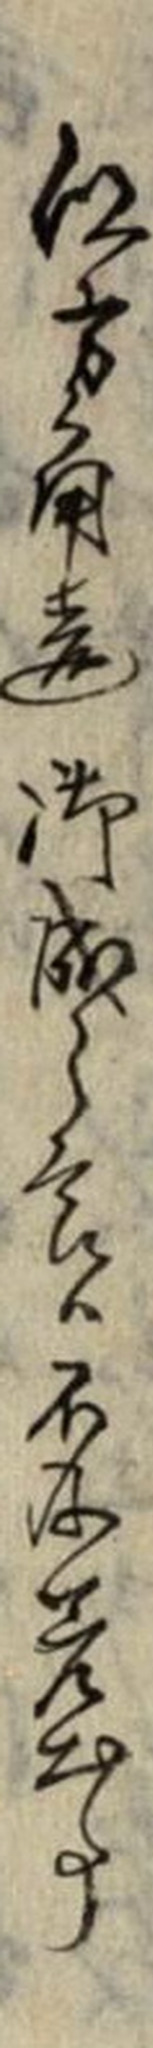但方角違御成之節は不及差出事

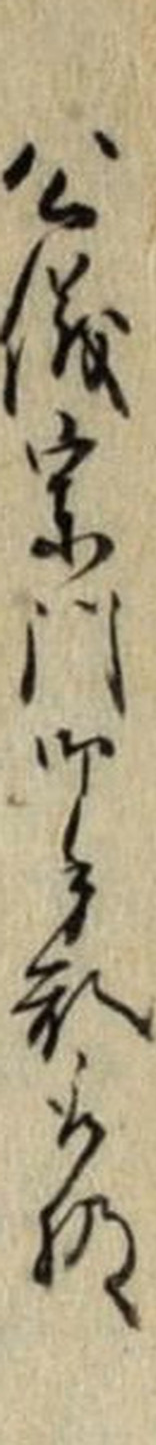公儀宗門御手形取扱
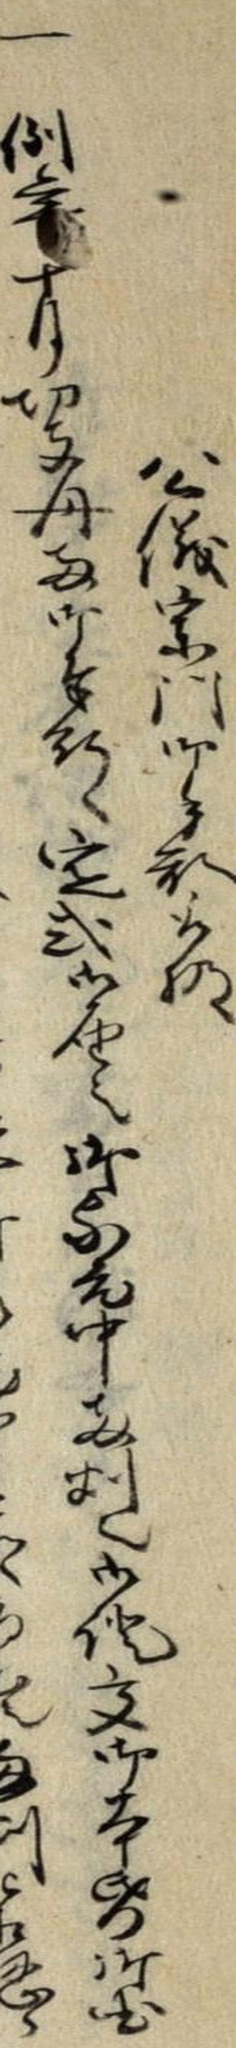一例年十月切支丹両御奉行へ定式御届之御家老中両判之御證文御本紙御国
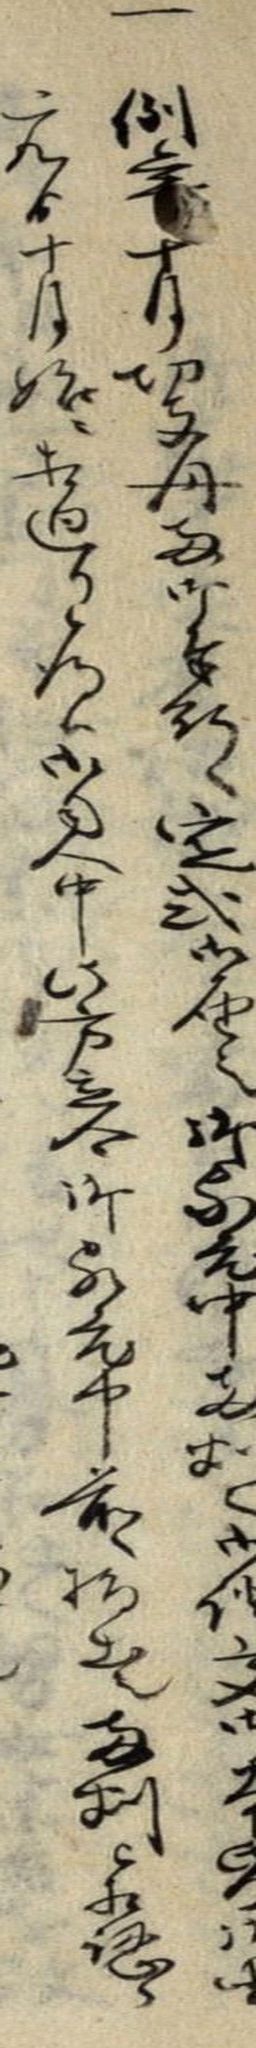元ゟ十月始に相廻り候得は御用人中此方立合御家老中前へ指出し両判被相認候
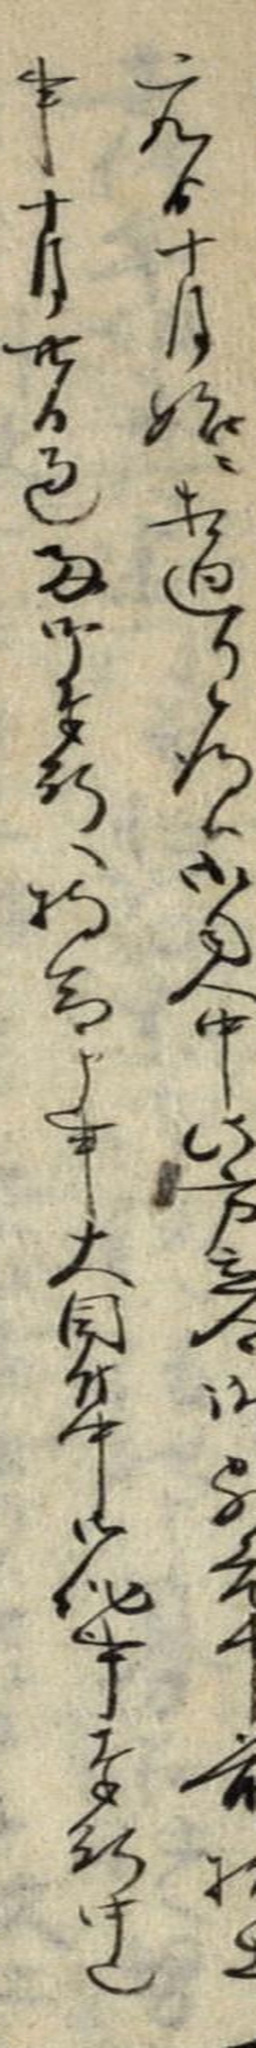事十月廿日過両御奉行へ持参申事大目付中御作事奉行中也
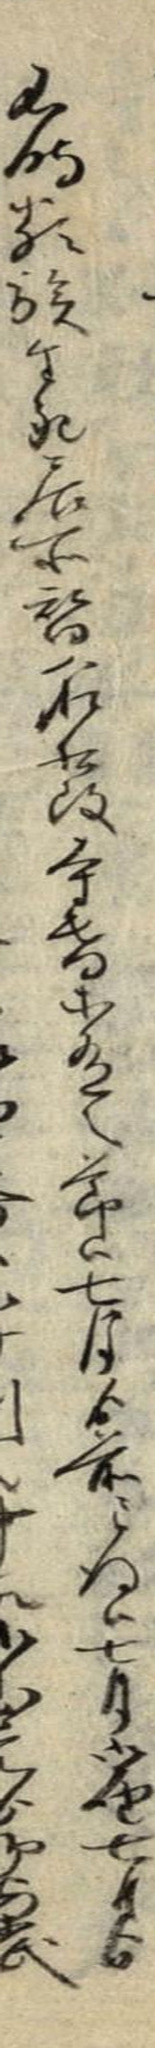一不時類族生死居所替名相改寺替等有之節は七月ゟ前に候得は七月御届七月ゟ
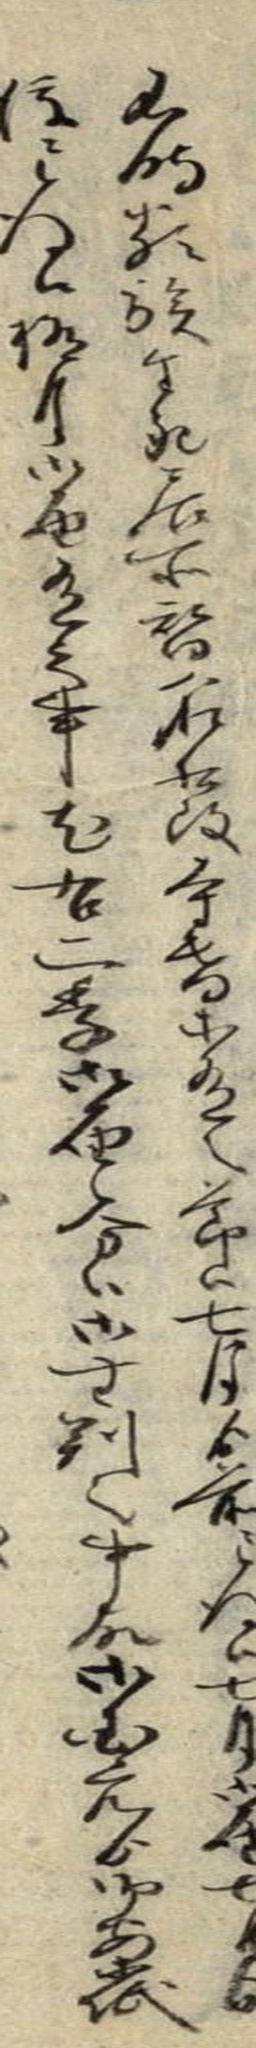後に候得は極月御届有之事尤右二季御届之分は御無判之事故御国元ゟ御案紙
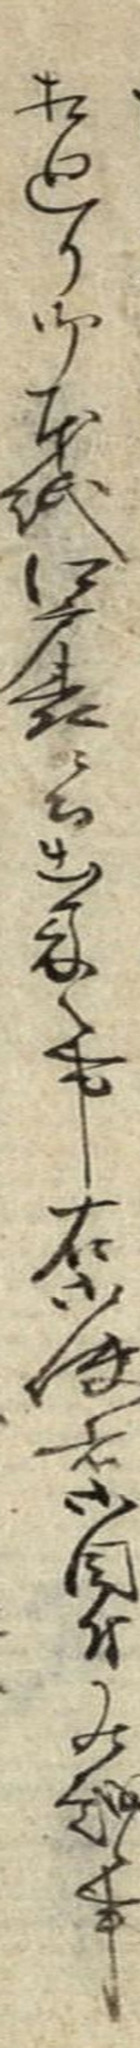相廻り御本紙江戸表にて出来之事右御使者御目付罷越候事
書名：三都并道中之部
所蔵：福井県文書館 Fukui Prefectural Archives
